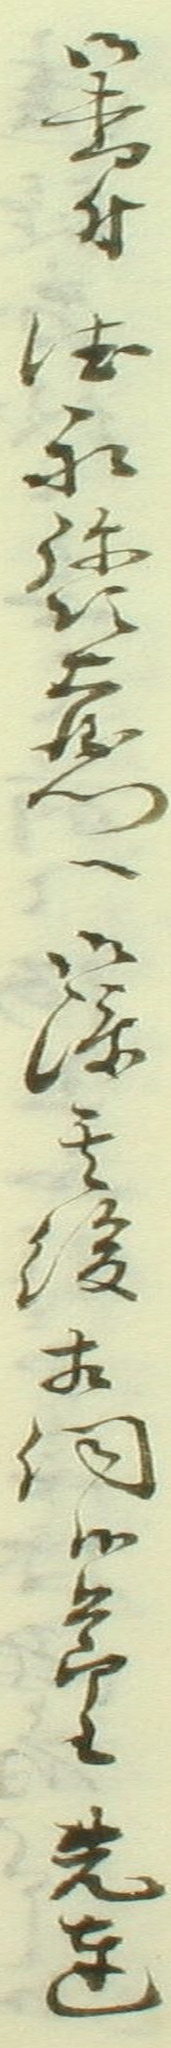御書付徳永弥次右衛門へ御渡其後相伺候節も先達
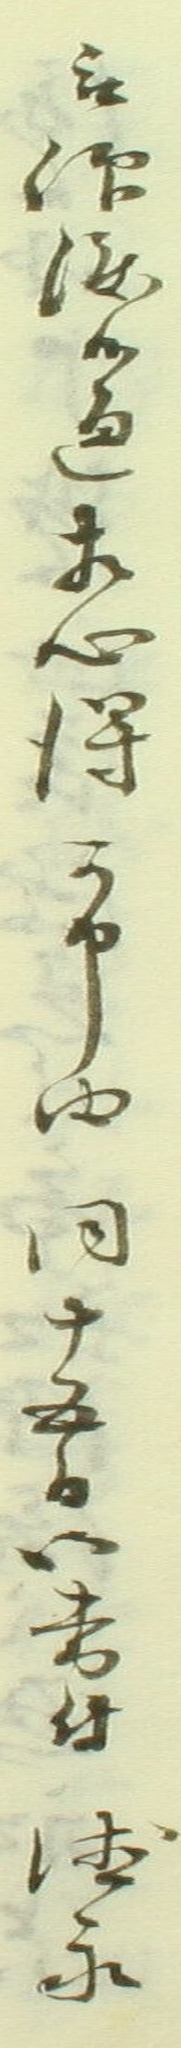被仰渡候通相心得可申由同十五日御書付徳永
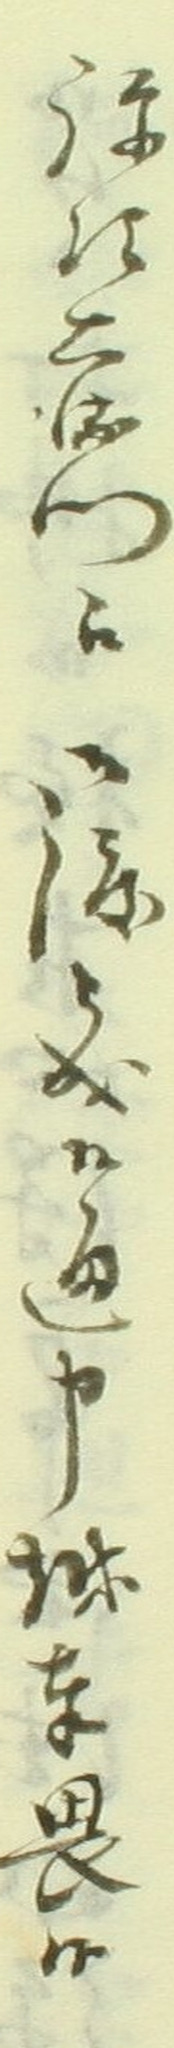弥次右衛門え御渡被成候通申越奉畏候
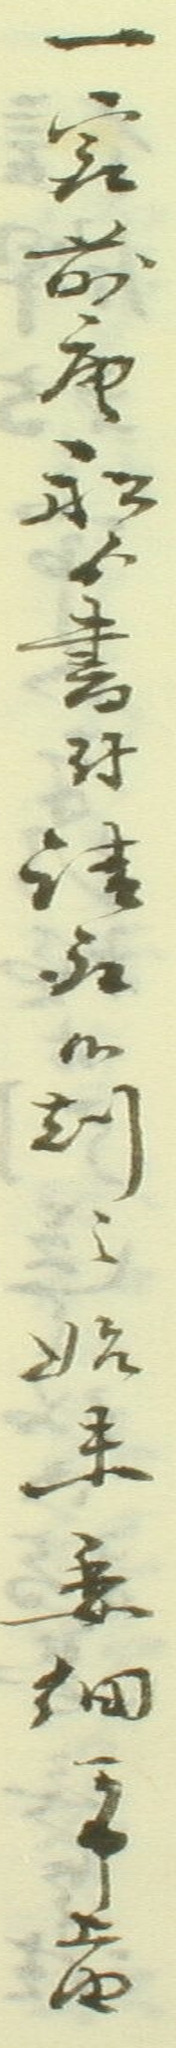一最前唐船ゟ書付請取候刻之始末委細可申上由
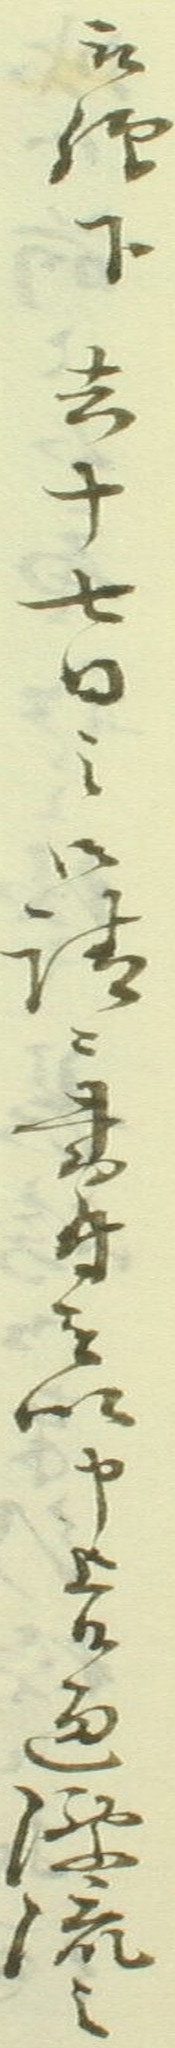被仰下去十七日之御請に書付を以申上候通漂流之
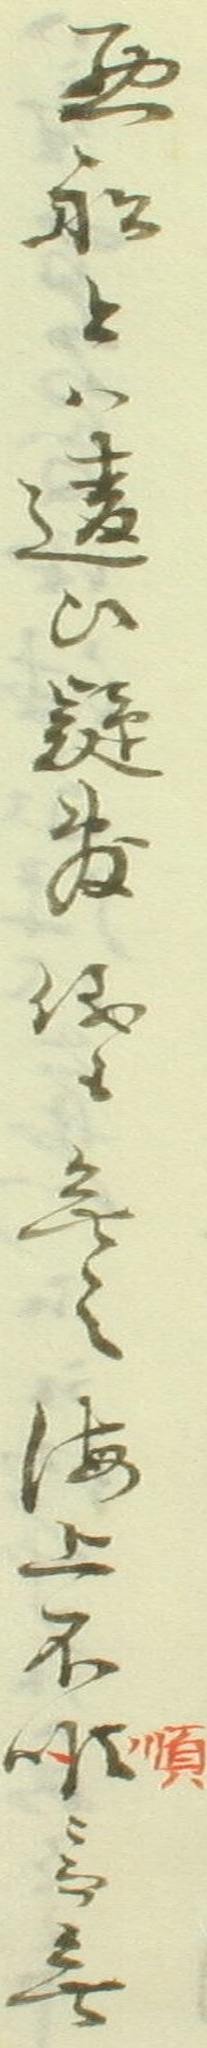悪船とは違ひ疑敷儀も無之海上不順に而無
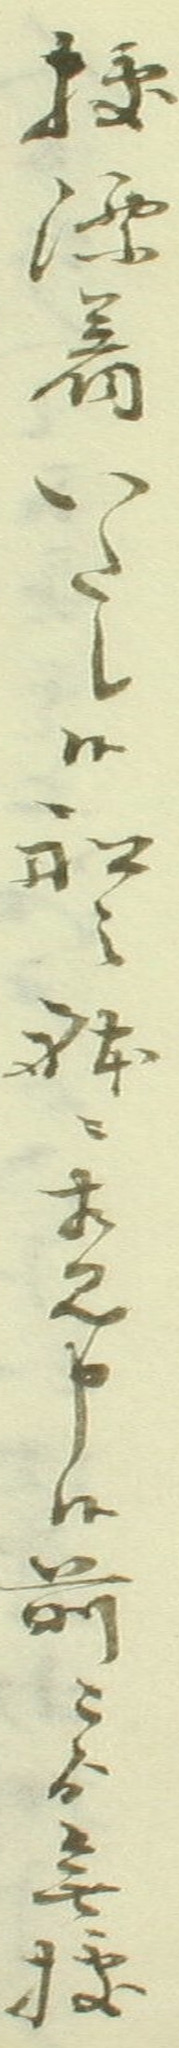拠漂着いたし候船之躰に相見申候前々ゟ無拠
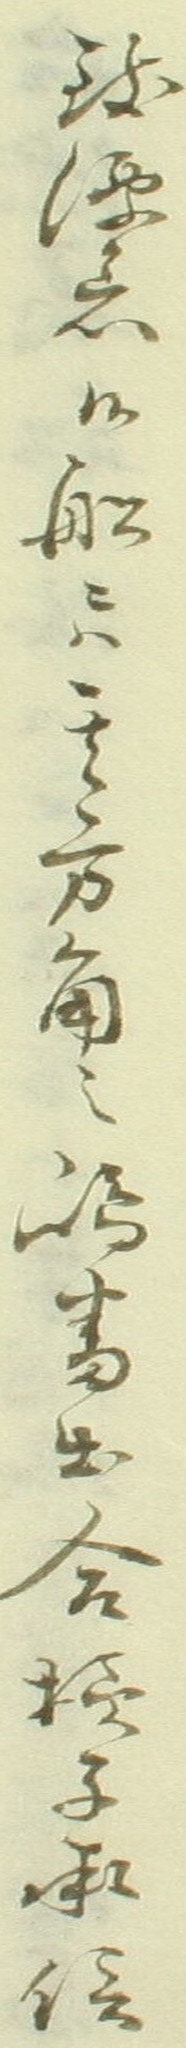致漂着候船には其方角之嶋番出合様子承信
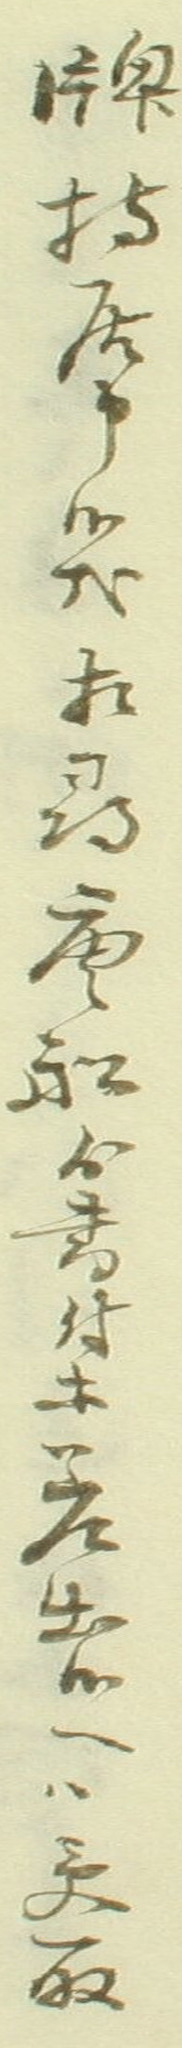牌持居申候哉相尋唐船ゟ書付等差出候へは受取
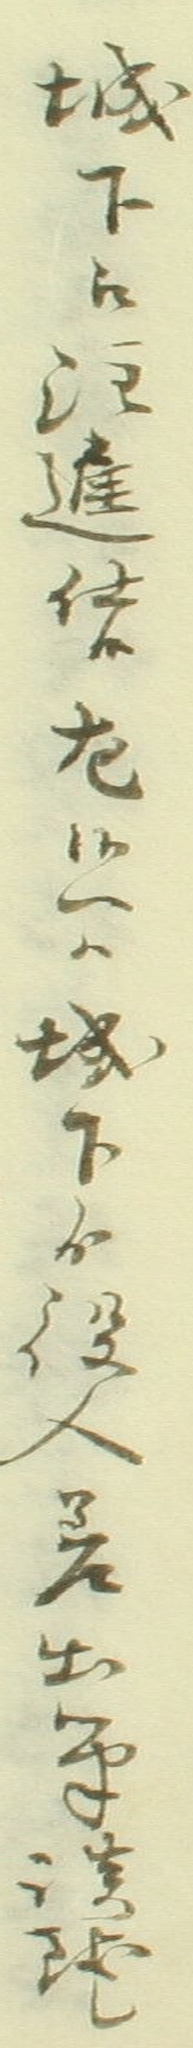城下え注進仕候左候へは城下ゟ役人差出筆談致し
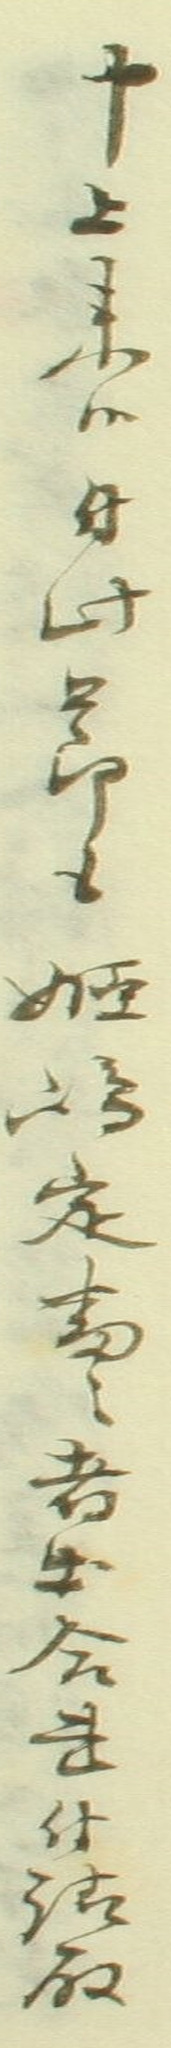申上参候付此節も姫島定番之者出合書付請取
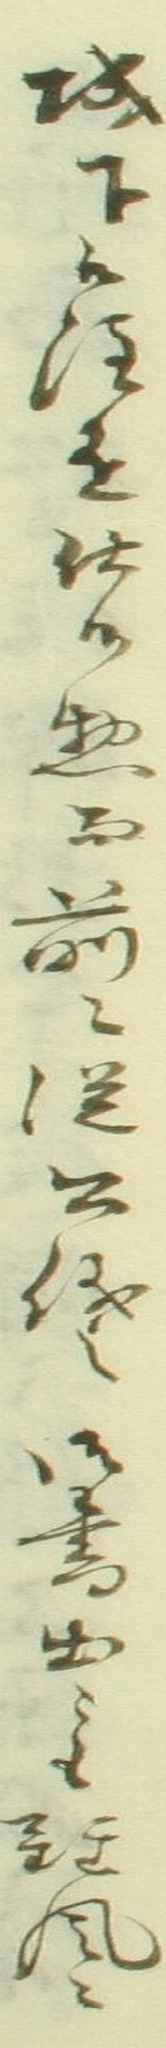城下御注進仕候惣而前々従公儀之御書出にも難風に
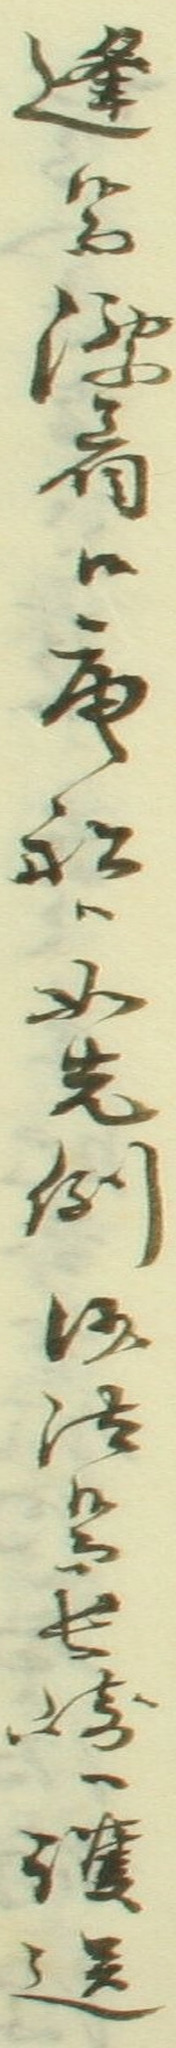逢候而漂着候唐船は如先例沙汰候而護送

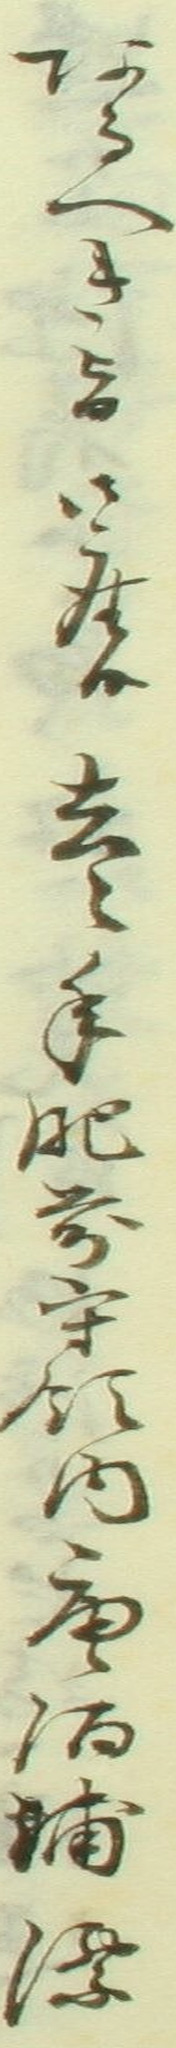あるへき旨御座候去々年肥前守領内唐泊浦漂
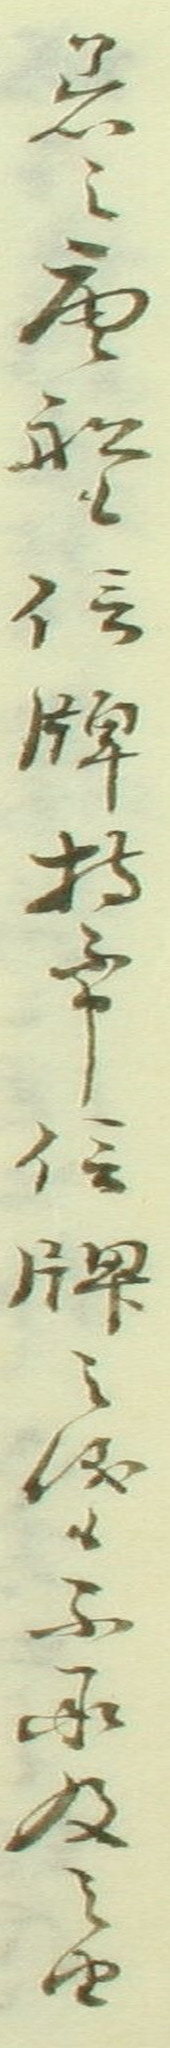着之唐船も信牌持不申信牌之儀も不承及之由
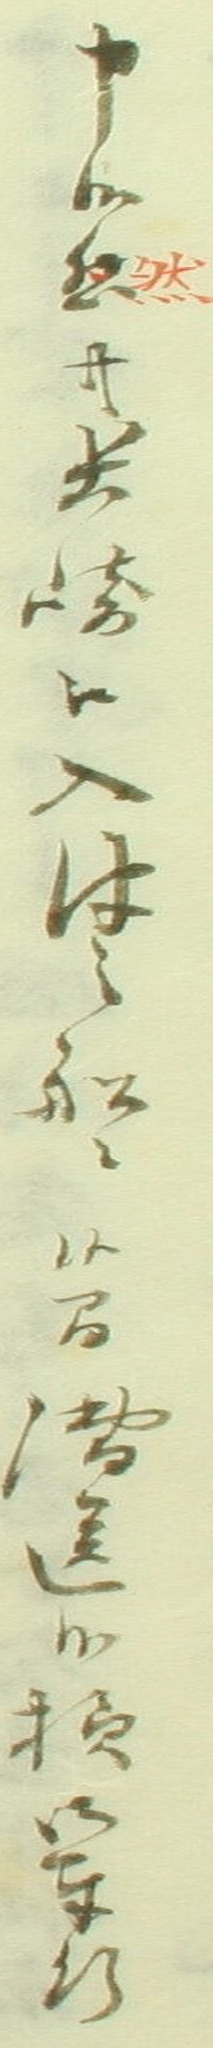申候共長崎え入津之船に候間漕送候様御奉行
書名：異国船漂着記
